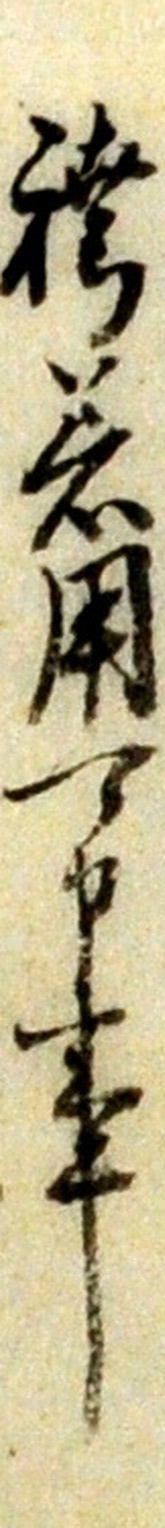袴着用可申事
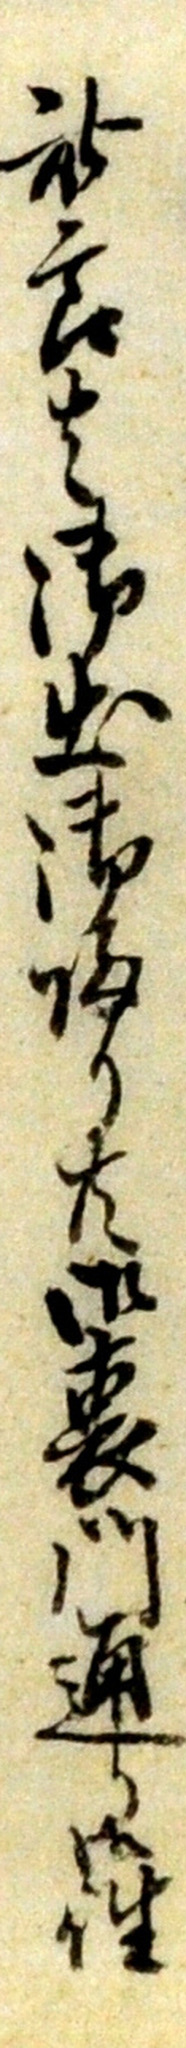此節者御出御帰り共御裏門通り御往
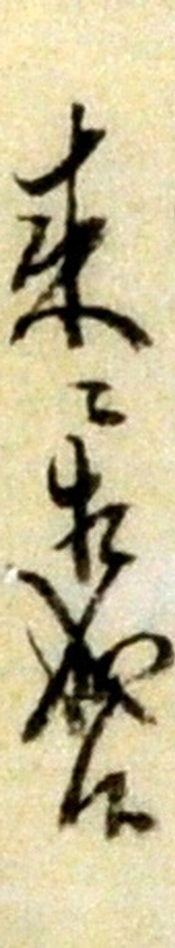来ニ相成候
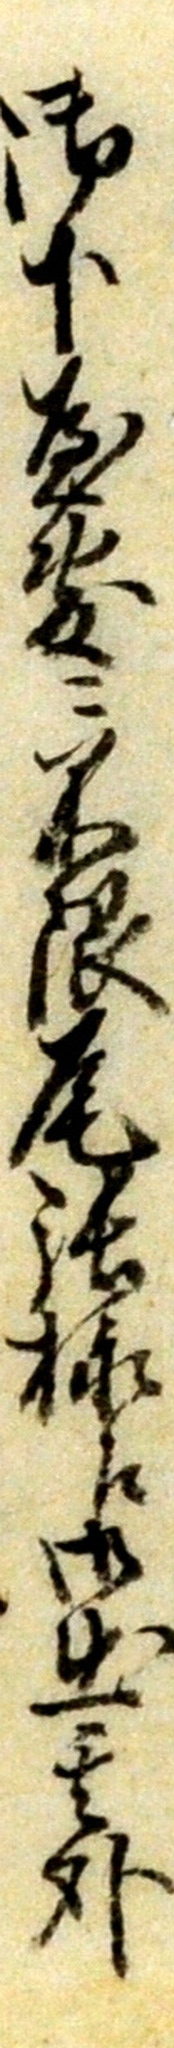御下屋敷ニ不限尾張様江御出其外
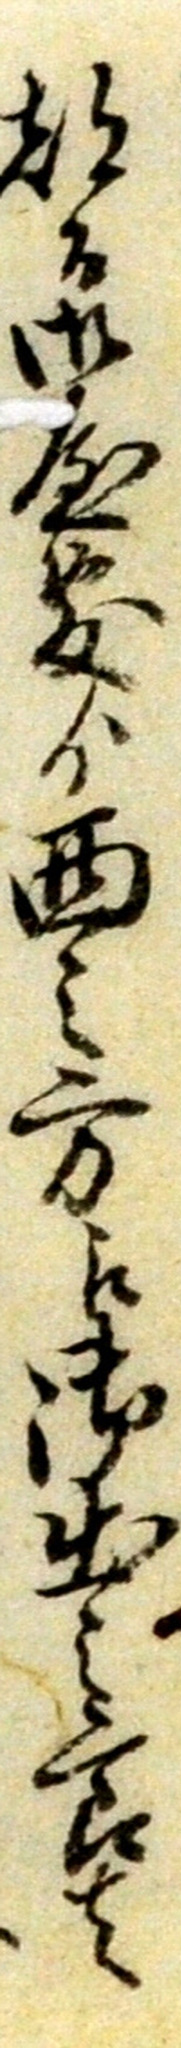都而御屋敷ゟ西之方江御出之節者
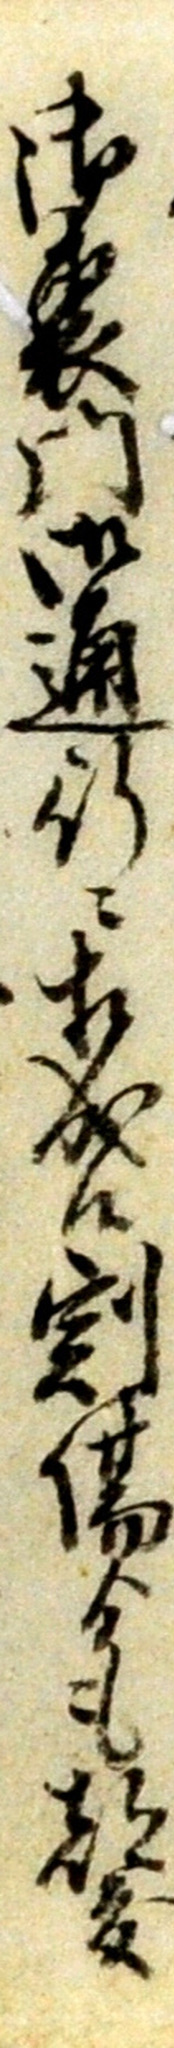御裏門御通行ニ相成候割場ゟも都度
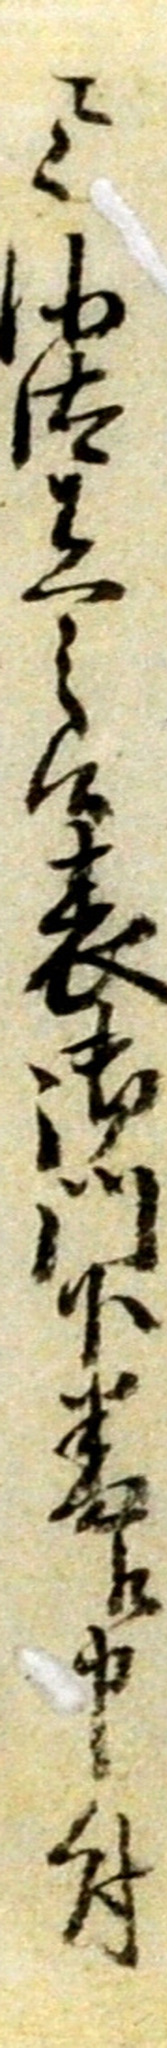云々沙汰有之候表御門下番江申付
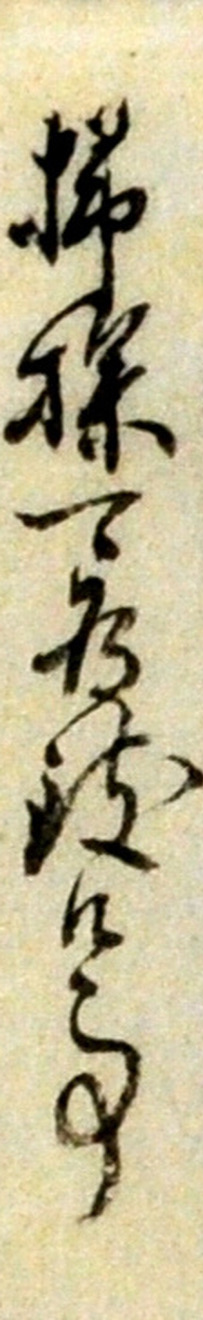掃除可為致候事
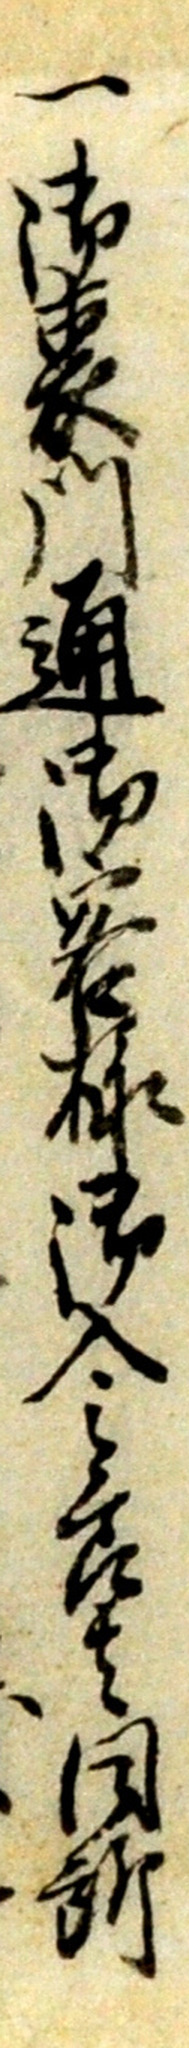一御裏門通御客様御入之節者同所
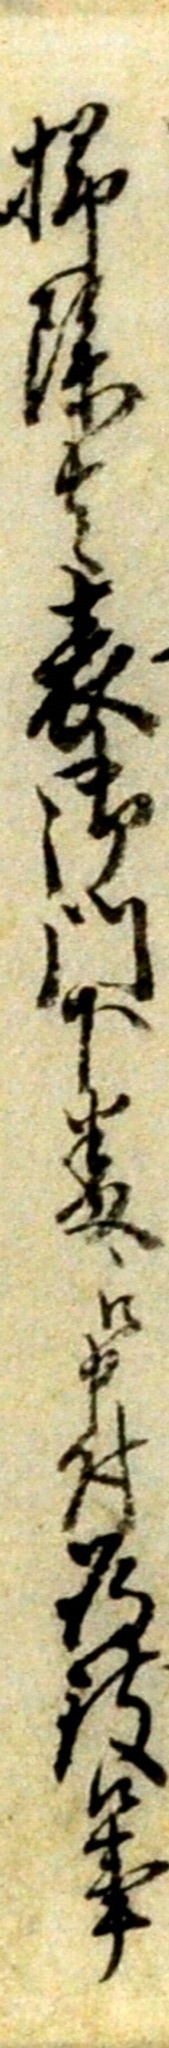掃除者表御門下番江申付為致候事
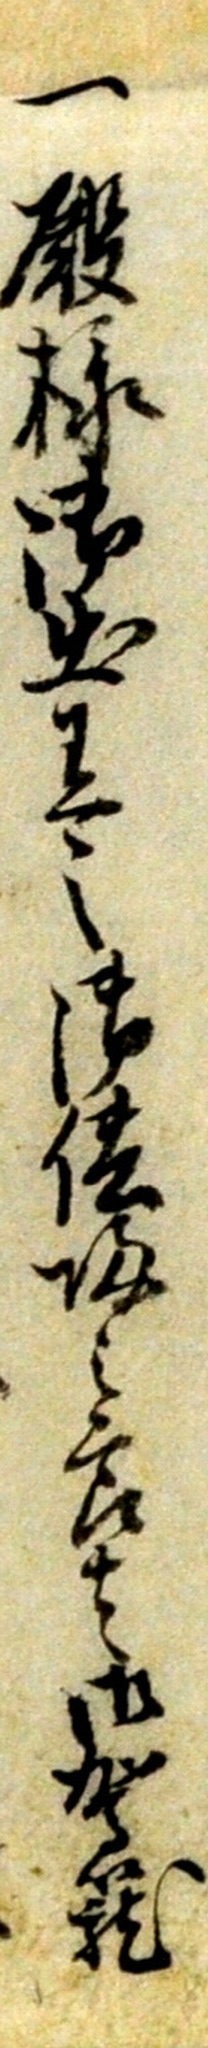一殿様御出有之御供帰之節者御駕籠
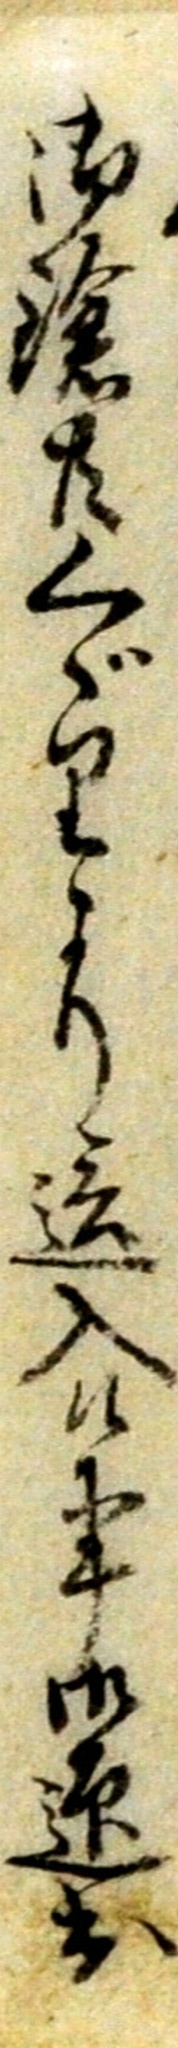御鑓共くぐりより這入候事御迎出
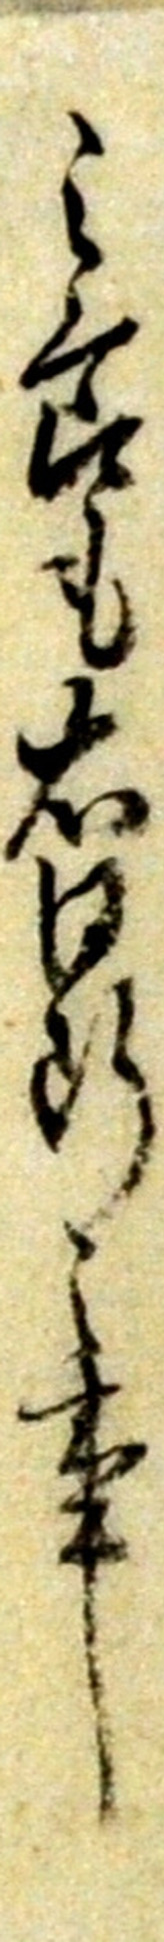之節も右同断之事

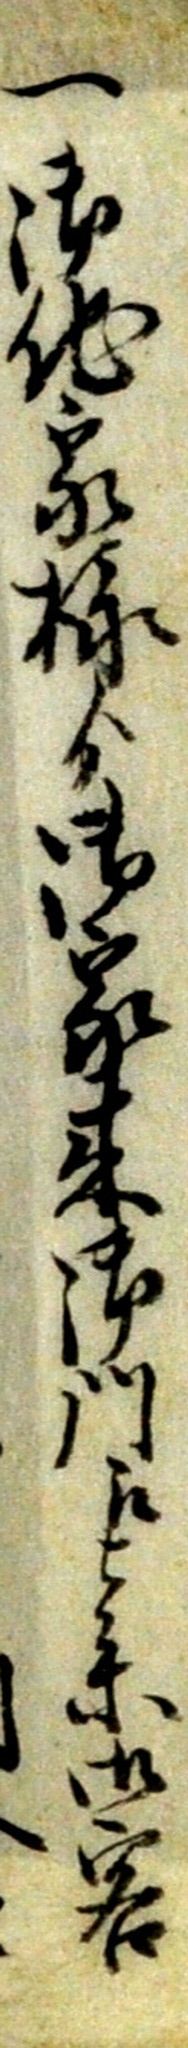一御他家様ゟ御家来御門江被参御客
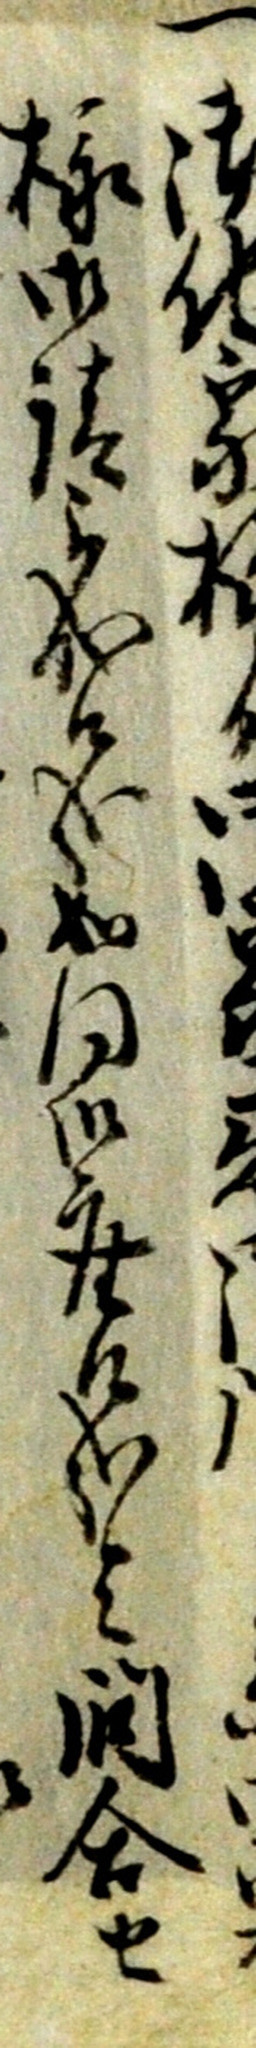様御請被成候哉如同御座候哉と問合セ
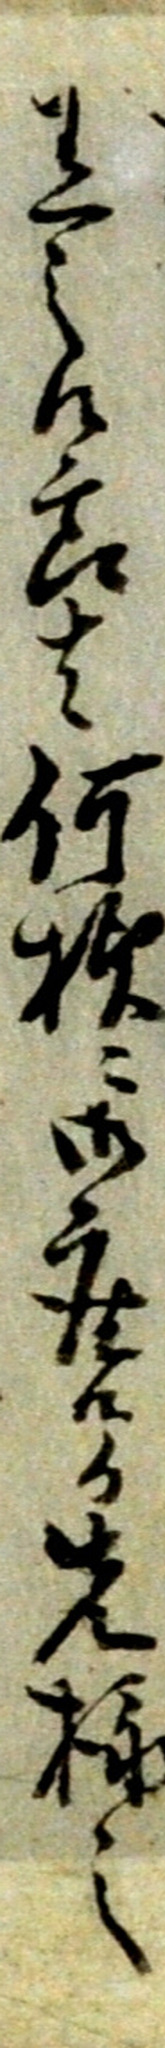有之候節者何様ニ御座候か先様之
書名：御先手組江戸御屋敷御門番勤方
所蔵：伊那市立高遠町図書館・合同会社AMANE
